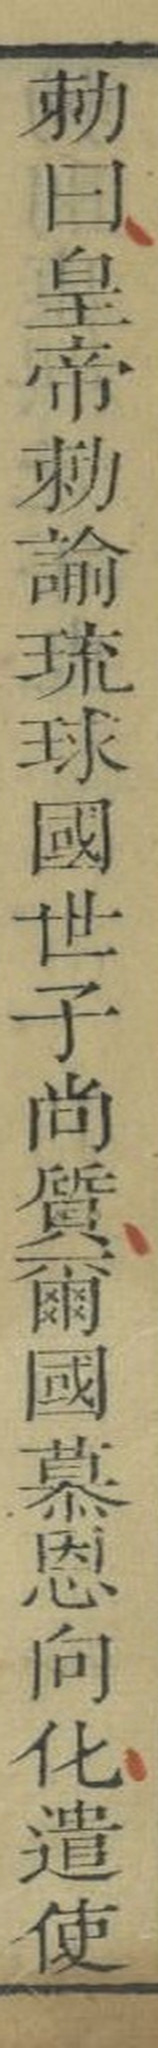勅曰皇帝勅諭琉球国世子尚質爾国慕恩向化遣使
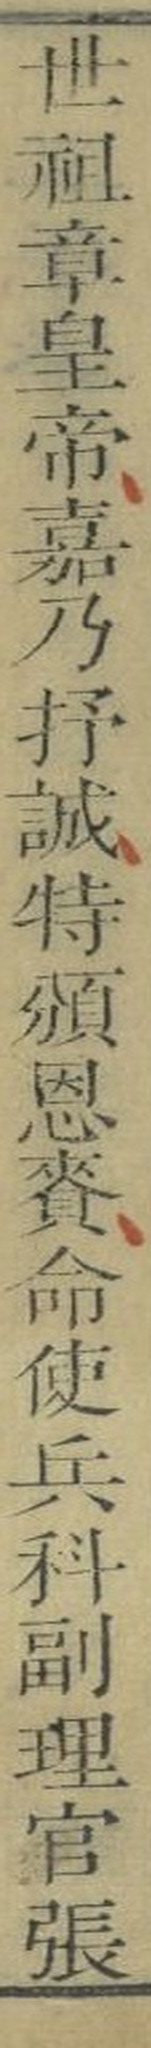世祖章皇帝嘉乃抒誠特頒恩賚命使兵科副理官張
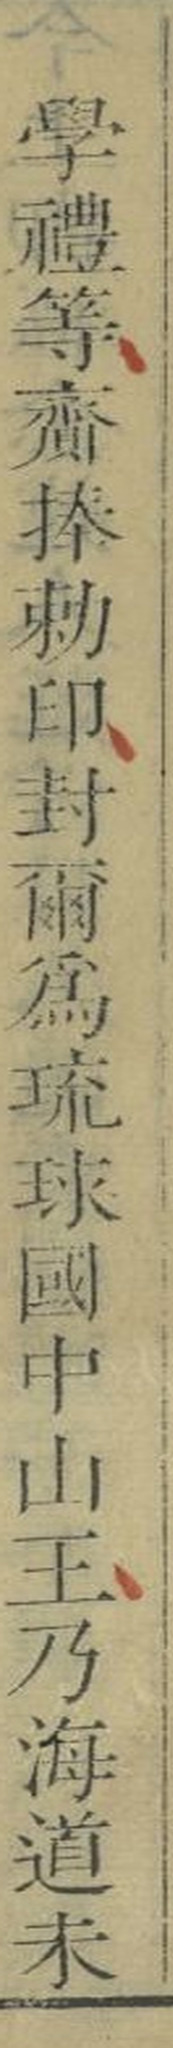学礼等齎捧勅印封爾為琉球国中山王乃海道未
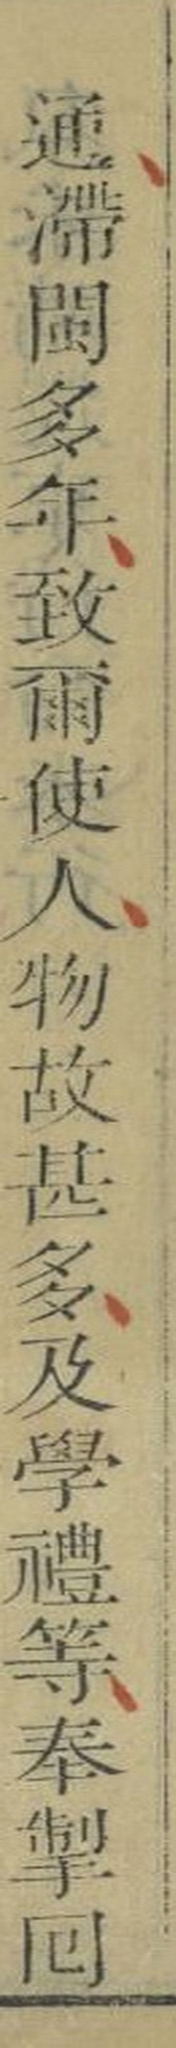通滞閩多年致爾使人物故甚多及学礼等奉掣回
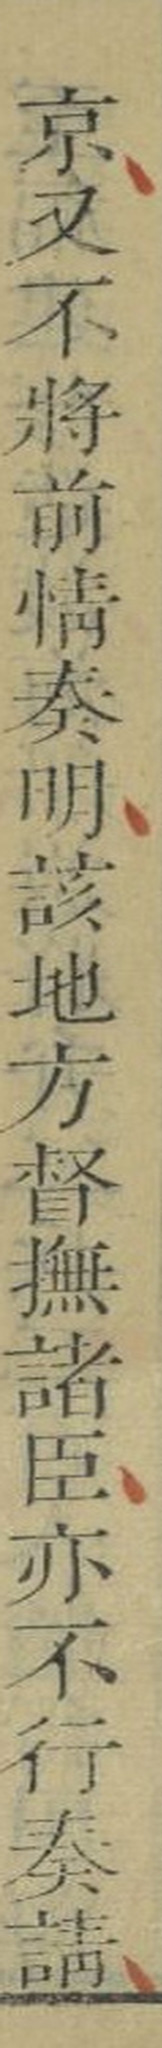京又不将前情奏明該地方督撫諸臣亦不行奏請
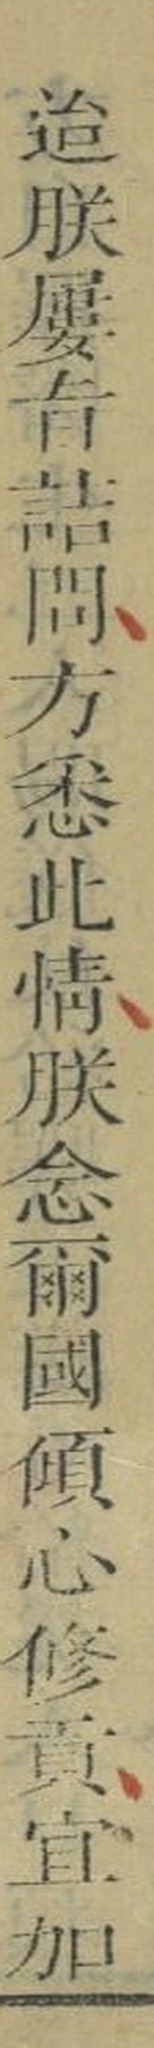迨朕屢旨詰問方悉此情朕念爾国傾心修貢宜加
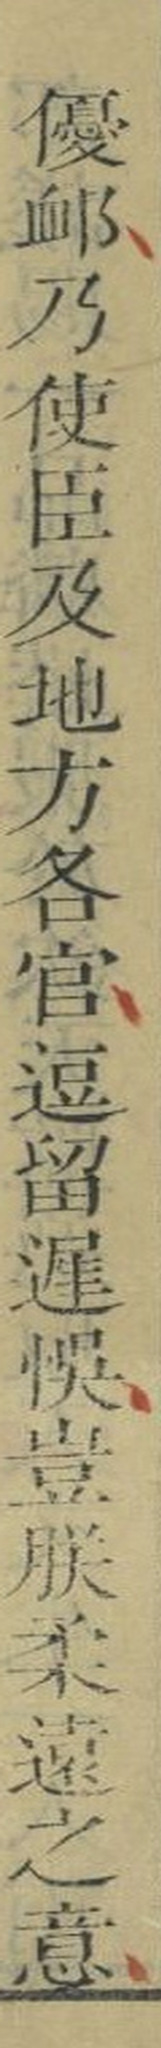優恤乃使臣及地方各官逗留遅悞豈朕柔遠之意
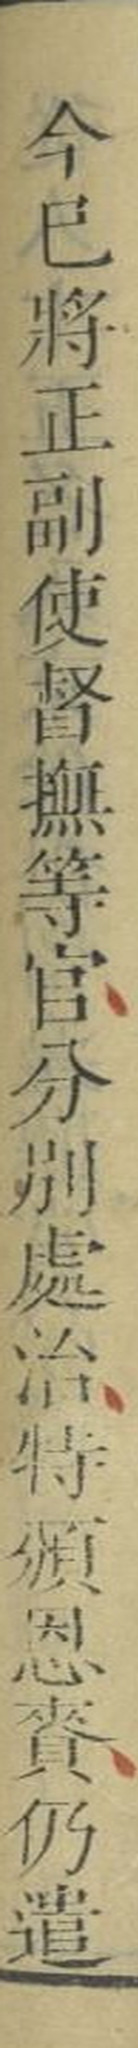今巳将正副使督撫等官分別処治特頒恩賚仍遣
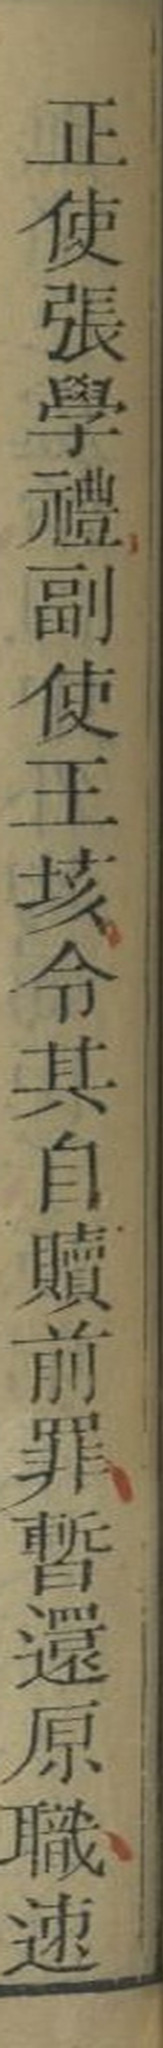正使張学礼副使王垓令其自贖前罪暫還原職速
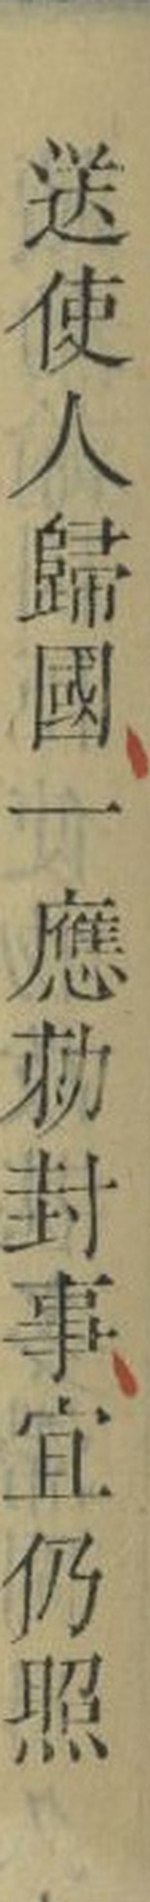送使人帰国一応勅封事宜仍照
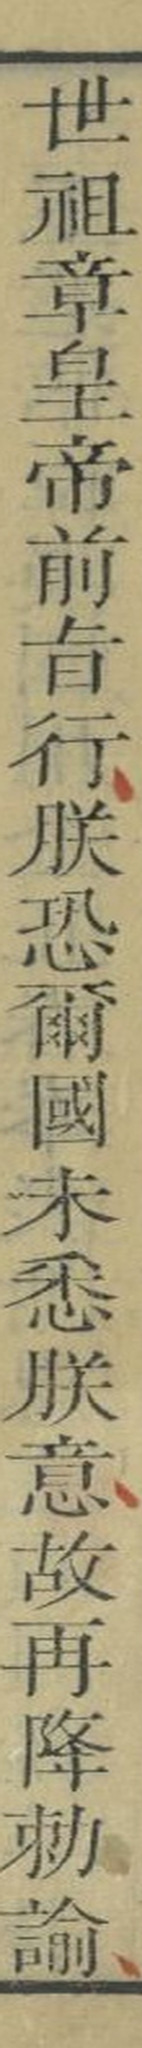世祖章皇帝前旨行朕恐爾国未悉朕意故再降勅諭
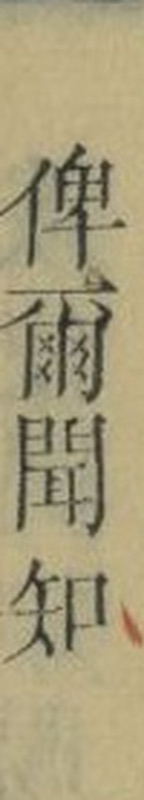俾爾聞知
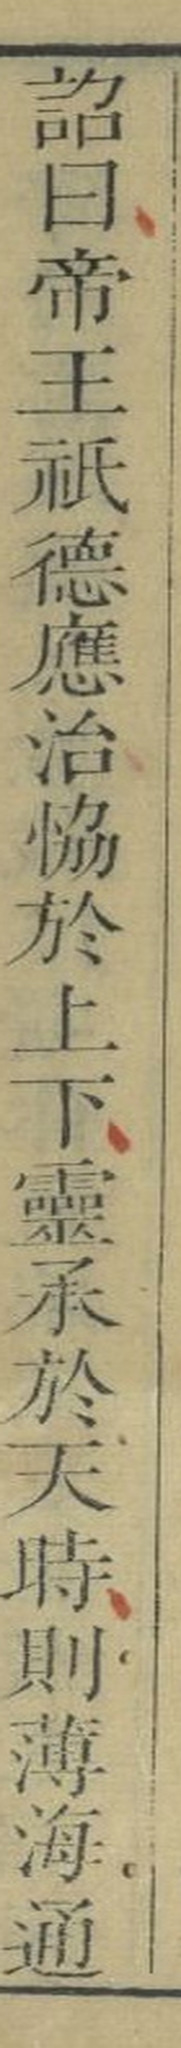詔曰帝王祇徳応治恊於上下霊承於天時則薄海通
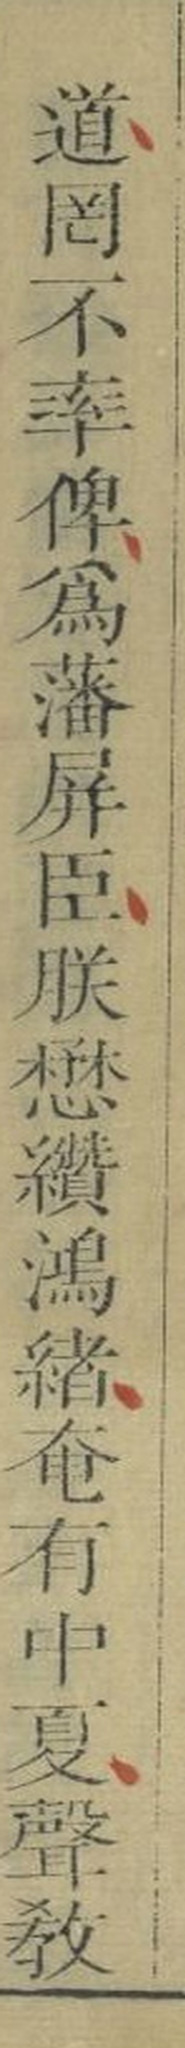道罔不率俾為藩屏臣朕懋纘鴻緒奄有中夏声教
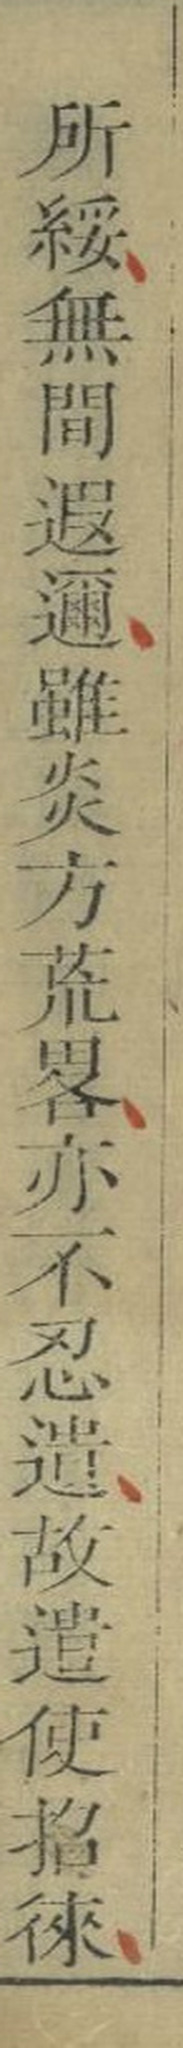所綏無間遐邇雖炎方荒略亦不忍遺故遣使招徠
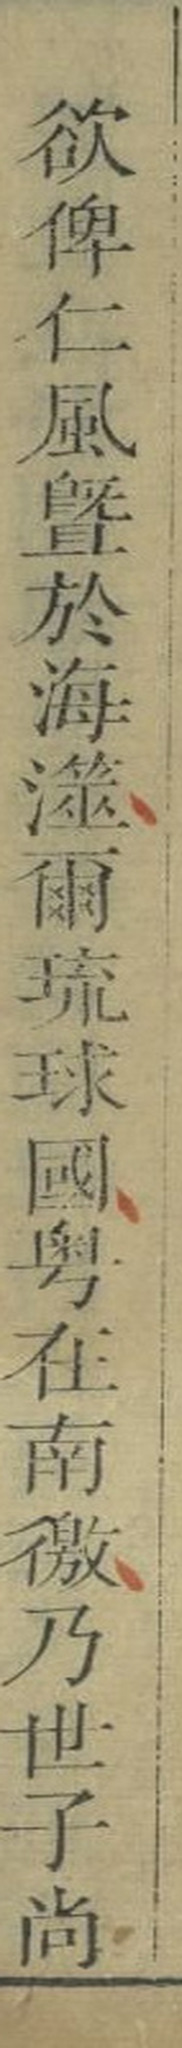欲俾仁風曁於海澨爾琉球国粤在南徼乃世子尚
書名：中山伝信録 巻三
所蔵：University of the Ryukyus Library
